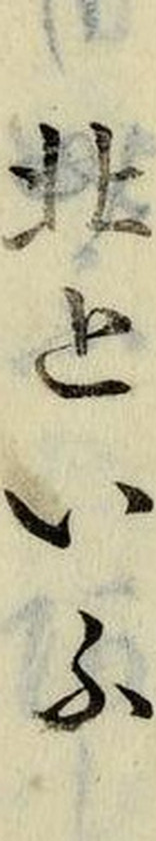北といふ
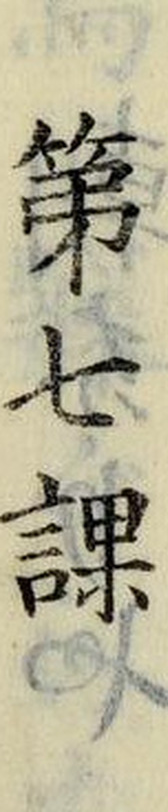第七課
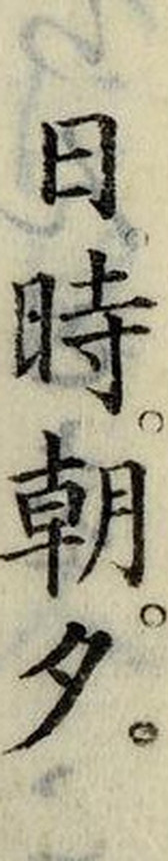日。時。朝。夕。
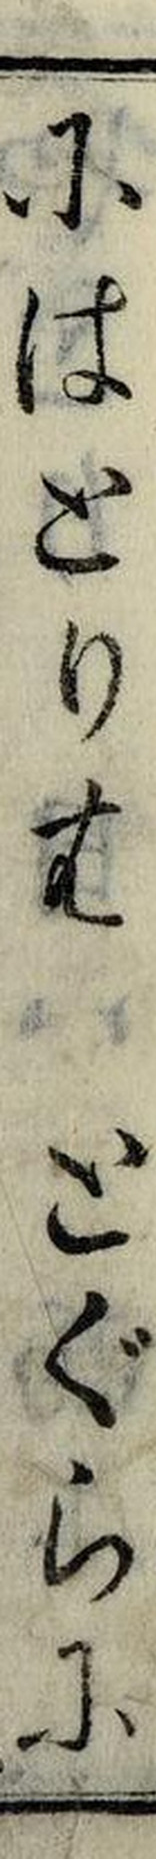にはとりはとぐらに

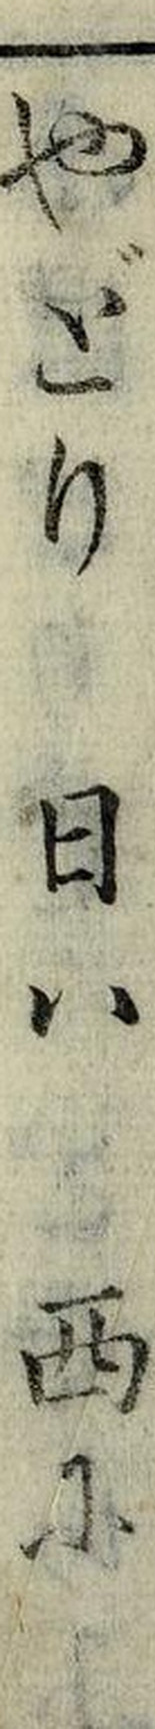やどり日は西に
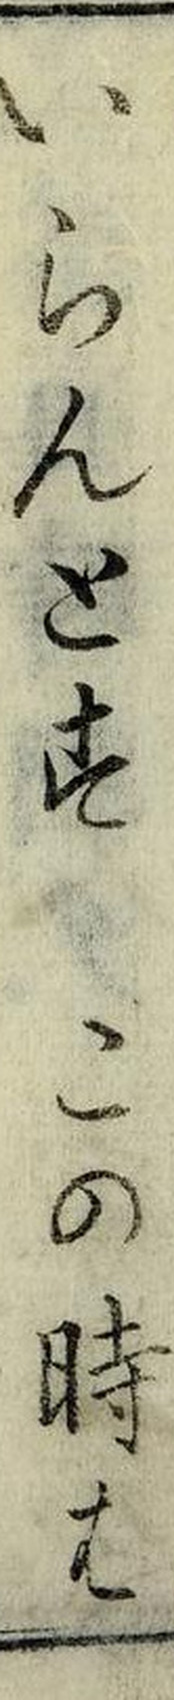いらんとすこの時は
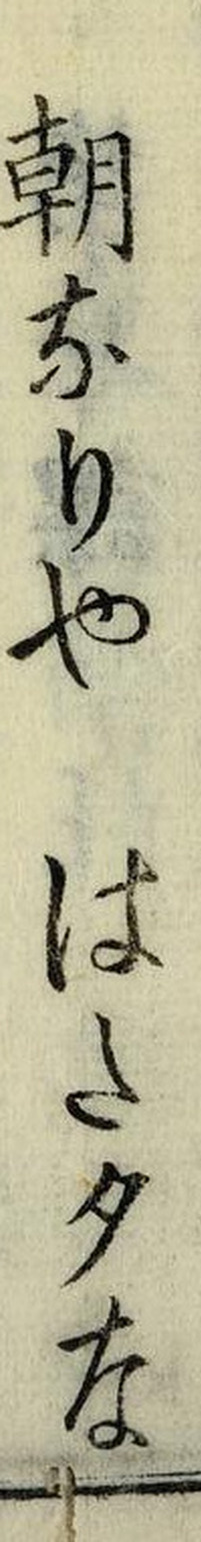朝なりやはた夕な
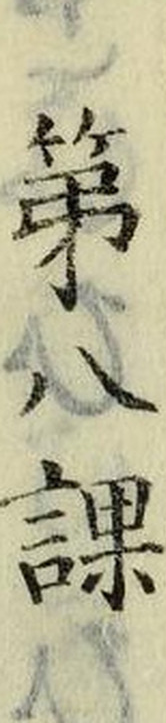第八課
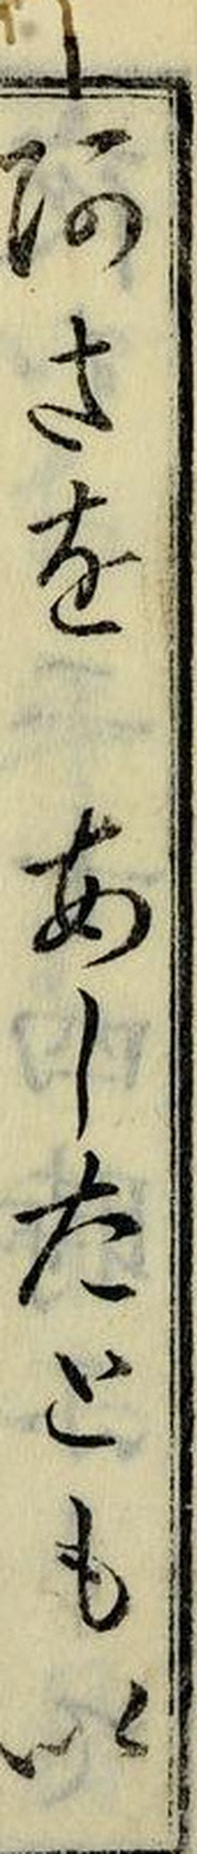あさをあしたともい
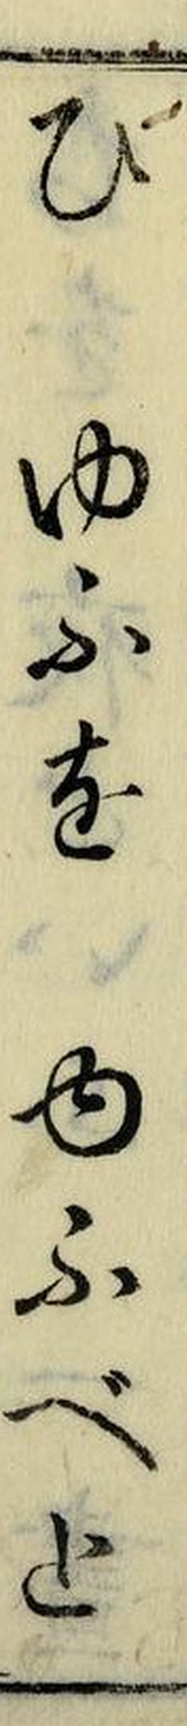ひゆふをゆふべと
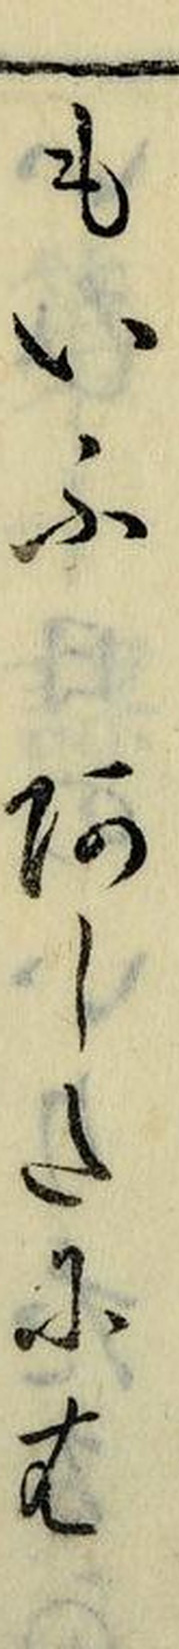もいふあしたには
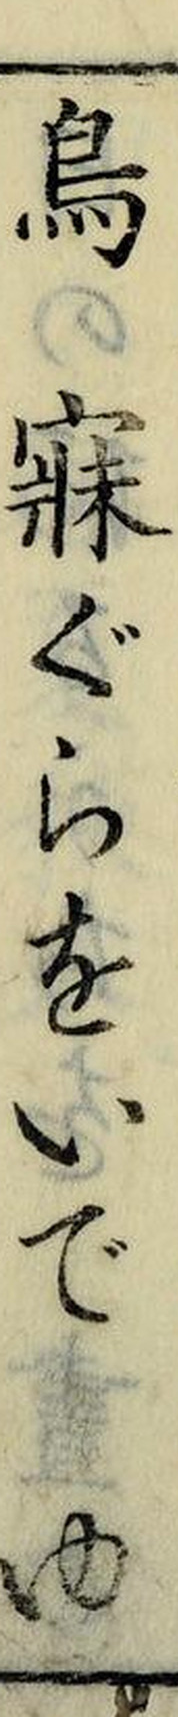鳥寐ぐらをいでゆ
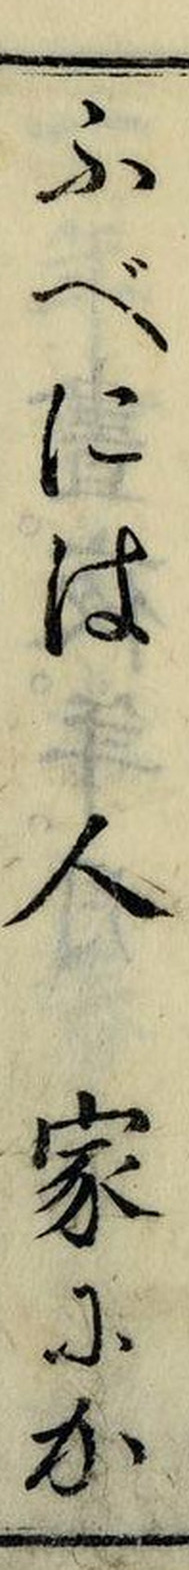ふべには人家にか

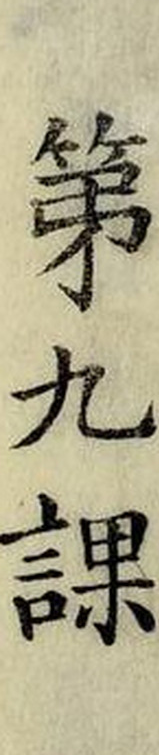第九課
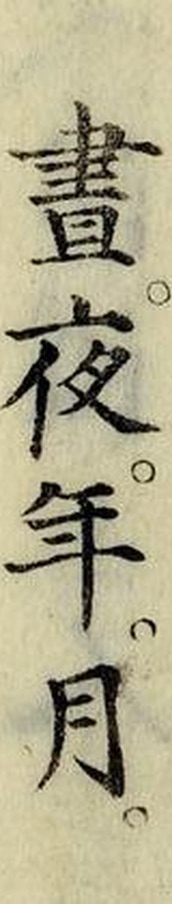昼。夜。年。月。
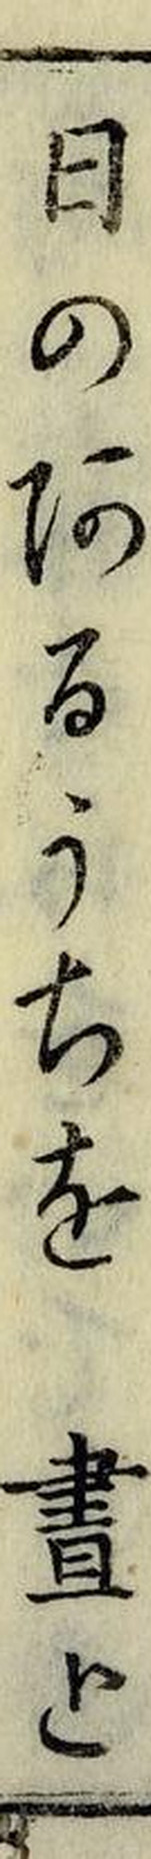日のあるうちを昼と
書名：小学読本 初等科 巻一
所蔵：福井県文書館 Fukui Prefectural Archives
